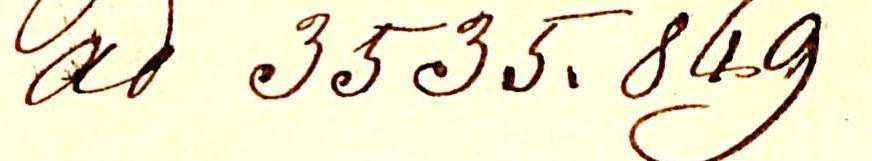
ad 3535.849
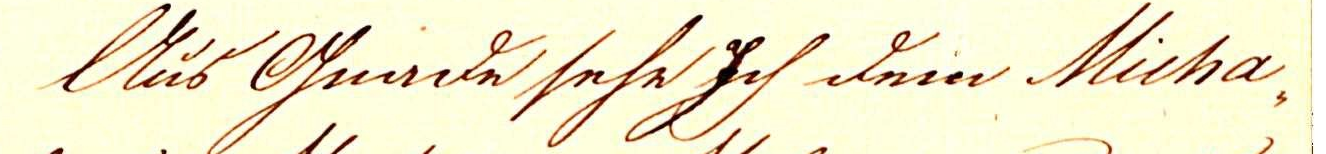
Aus Gnade sehe Ich dein Micha¬
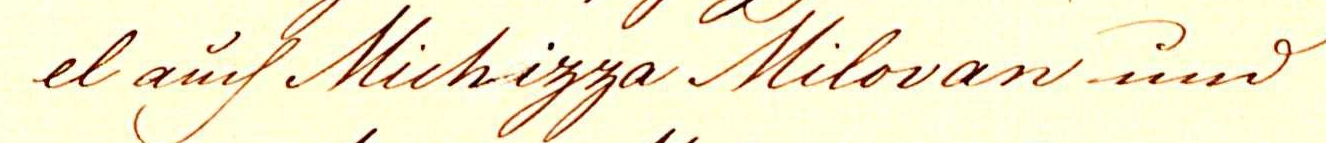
el auch Michizza Milovan und
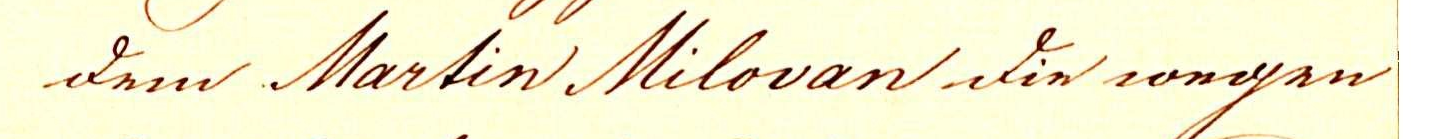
dem Martin Milovan die wegen
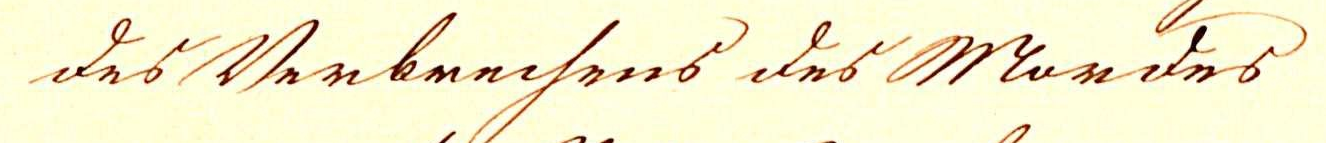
des Verbrechens des Mordes
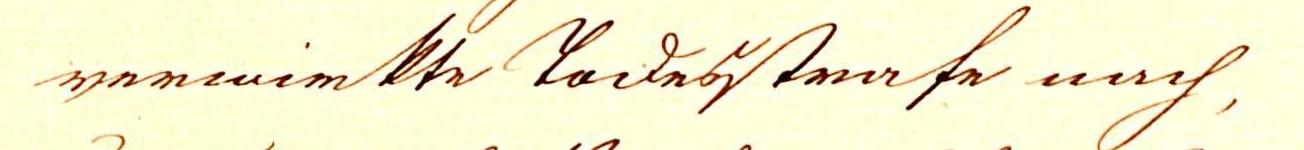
verwirkte Todestrafe nach,
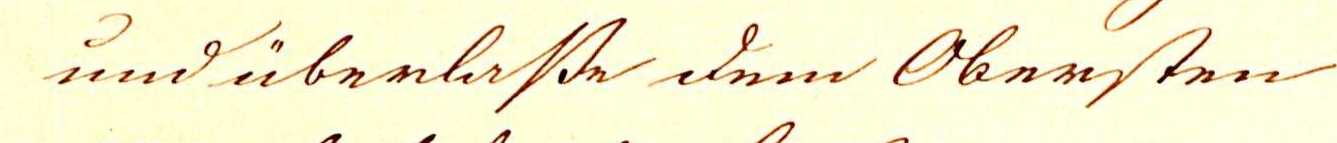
und überlaße dem Obersten
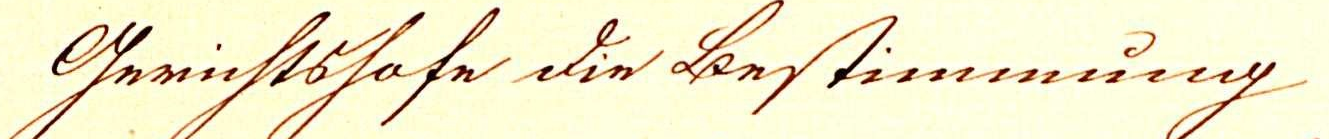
Gerichtshofe die Bestimmung
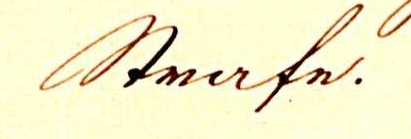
Strafe.
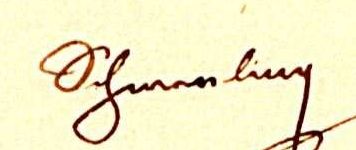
Schmeling
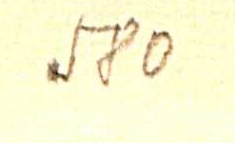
580
